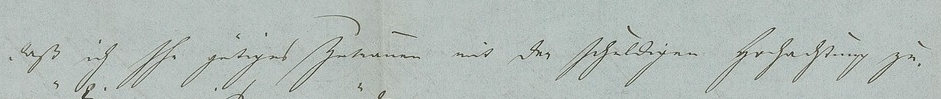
daß ich Ihr gütiges Zutrauen mit der schuldigen Hochachtung zu
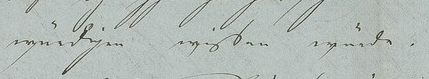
würdigen wissen würde.
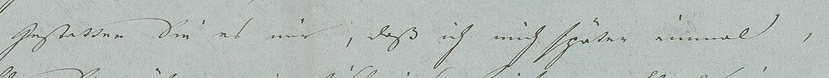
Gestatten Sie es mir, daß ich mich später einmal,
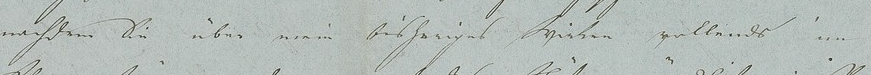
nachdem Sie über mein bisheriges Wirken vollends im
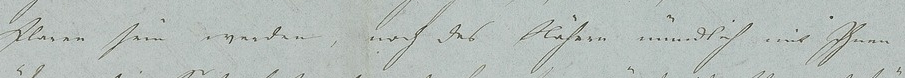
Klaren sein werden, noch des Nähern mündlich mit Ihnen
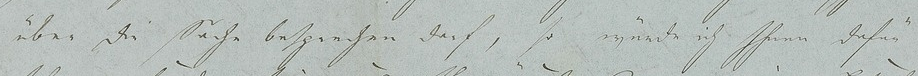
über die Sache besprechen darf, so würde ich Ihnen dafür
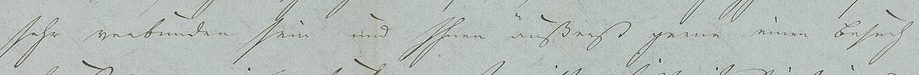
sehr verbunden sein und Ihnen äußerst gerne einen Besuch
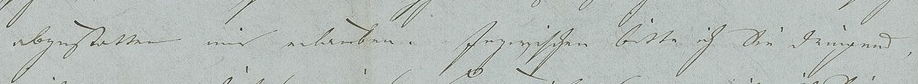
abzustatten mir erlauben. Inzwischen bitte ich Sie dringend,
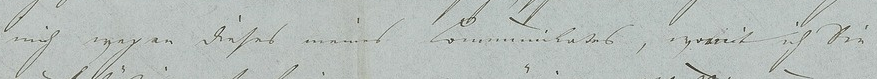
mich wegen dieses meines Communikates, womit ich Sie
